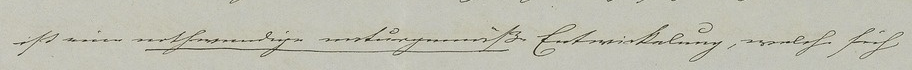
ist eine nothwendige naturgemäße Entwickelung, welche sich
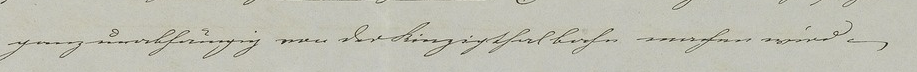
ganz unabhängig von der Kinzigthalbahn machen wird. –
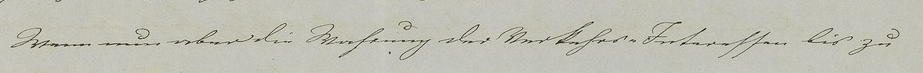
Wenn nun aber die Wahrung der Verkehrs-Interessen bis zu
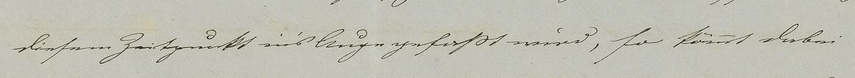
diesem Zeitpunkt in's Auge gefaßt wird, so kömmt dabei
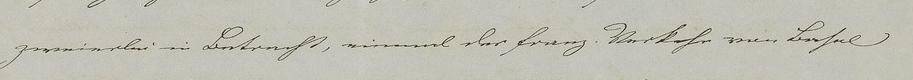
zweierlei in Betracht, einmal der franz. Verkehr von Basel
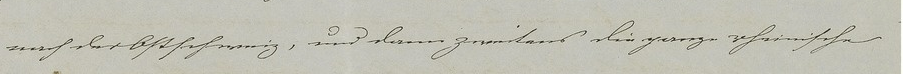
nach der Ostschweiz, und dann zweitens die ganze rheinische
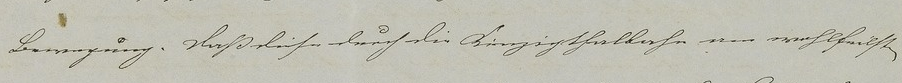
Bewegung. Daß diese durch die Kinzigthalbahn am wohlfeilsten
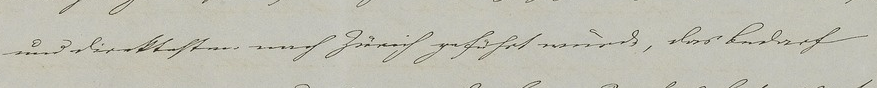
und direktesten nach Zürich geführt würde, das bedarf
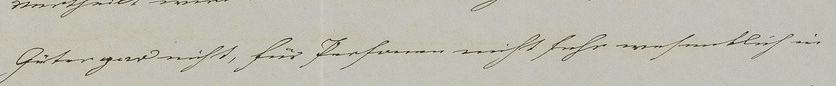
Güter gar nicht, für Personen nicht sehr wesentlich in
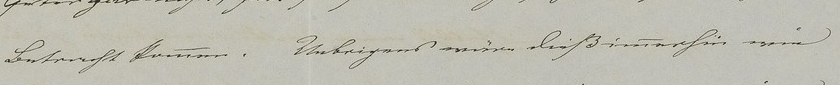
Betracht kommen. Uebrigens wäre dieß immerhin wie
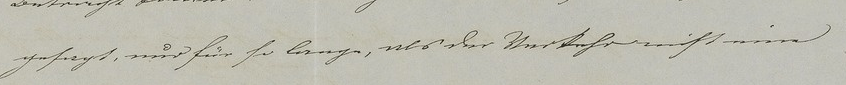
gesagt, nur für so lange, als der Verkehr nicht eine
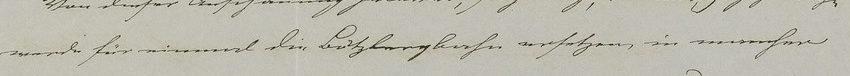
werde für einmal die Bötzbergbahn ersetzen, in mancher
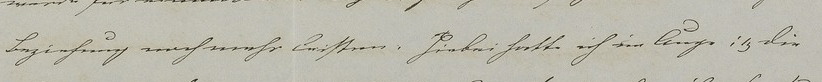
Beziehung noch mehr leisten. Hiebei hatte ich im Auge: 1) die
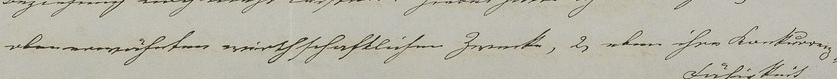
oben erwähnten wirtschaftlichen Zwecke, 2) eben ihre Konkurrenz-
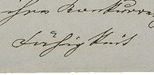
Fähigkeit
